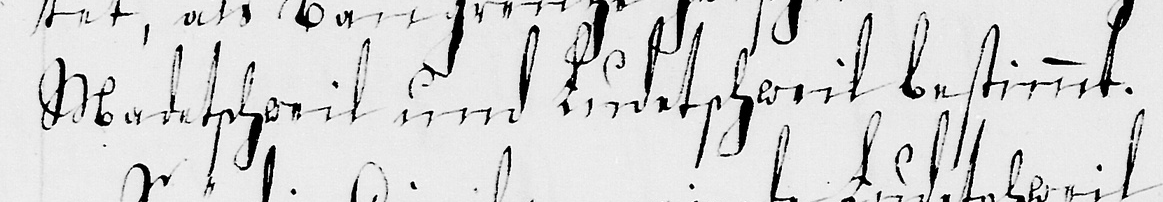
Madetschweil und Ludetschweil bestimmt.
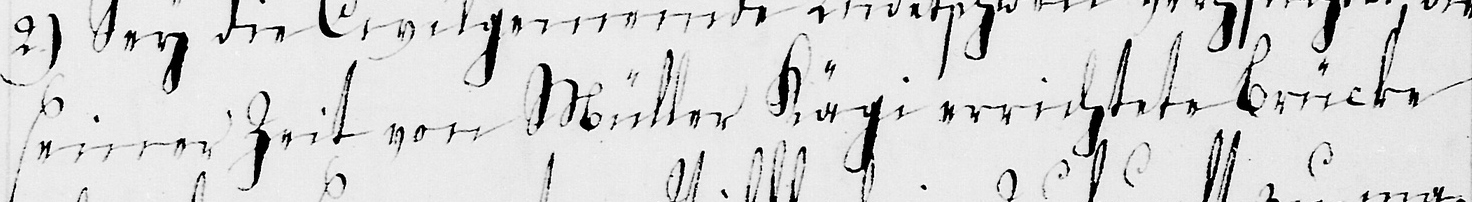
seiner Zeit von Müller Kägi errichtete Brücke
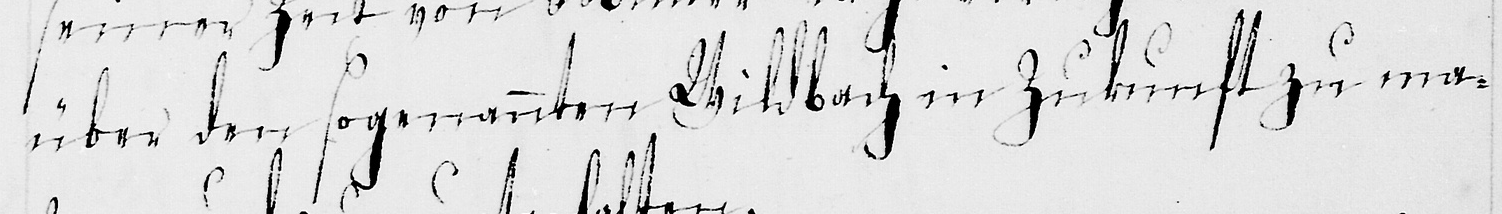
über den sogenannten Wildbach in Zukunft zu ma¬
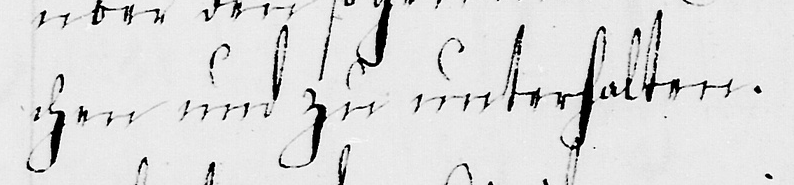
chen und zu unterhalten.
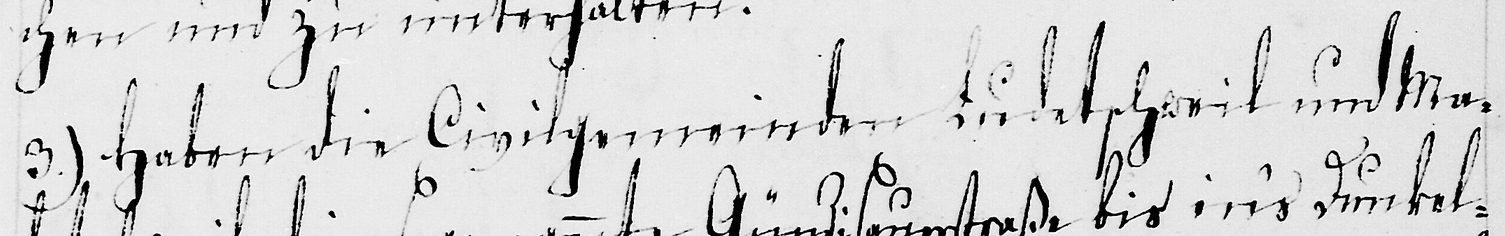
3.) Haben die Civilgemeinden Ludetschweil und Ma¬
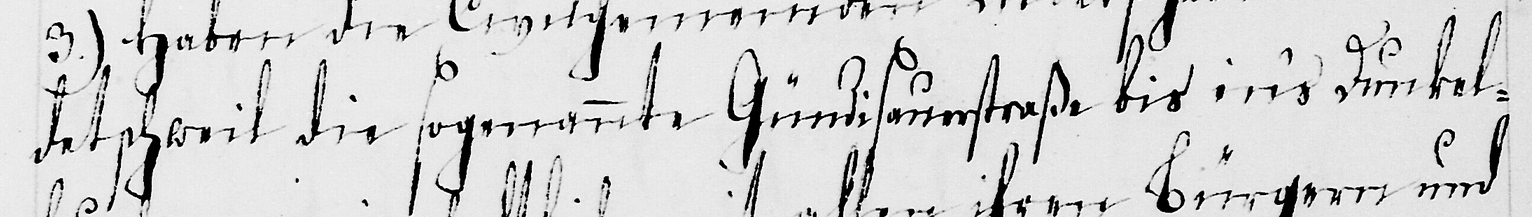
detschweil die sogenannte Gündisauerstraße bis ins Dunkel¬
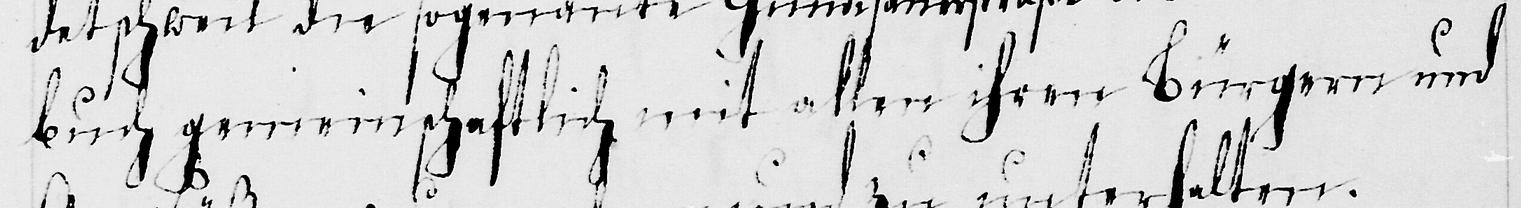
buch gemeinschaftlich mit allen ihren Bürgern und
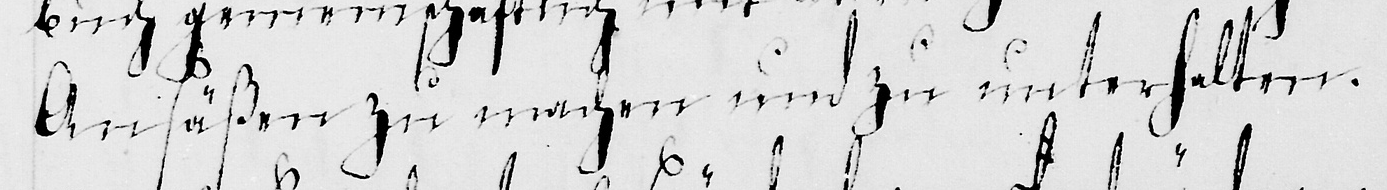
Ansäßen zu machen und zu unterhalten.
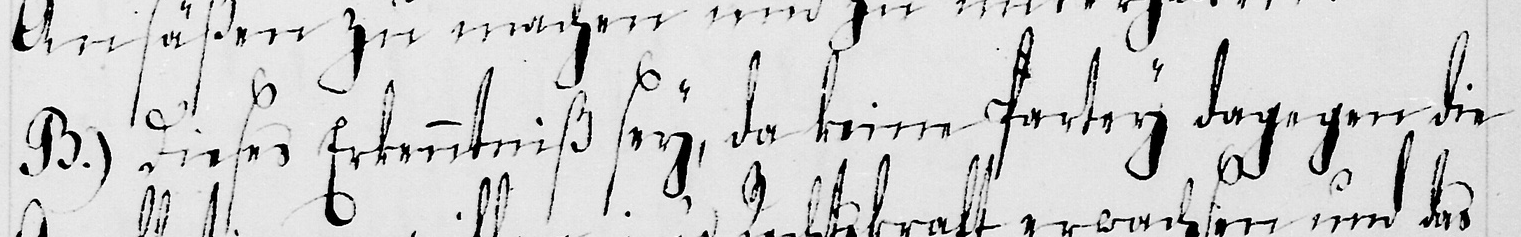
B.) Dieses Erkenntniß sey, da keine Partey dagegen die
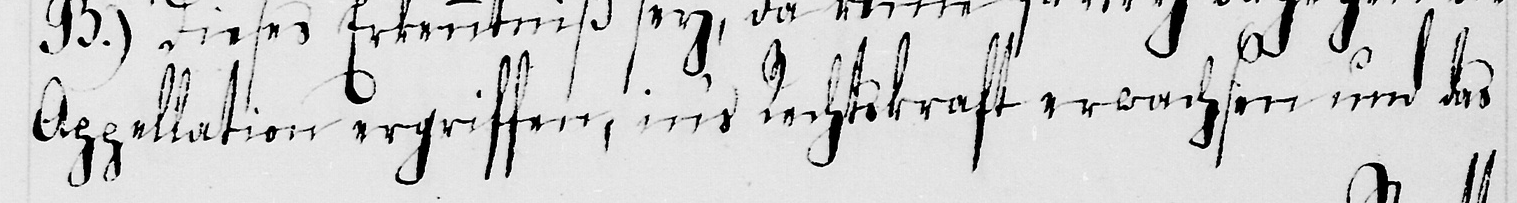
Appellation ergriffen, ins Rechtskraft erwachsen und das
